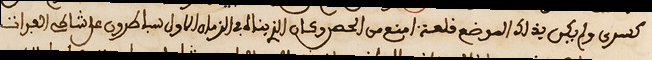كسرى و لم يكن بذلك الموضع قلعة امنع من الحصن و كان الذي بناه في الزمان الاول سباطرون على شاطى الفرات
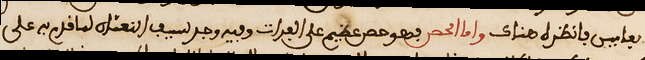بعامين فانظره هناك و اما امحص فهو حصن عظيم على الفر ت و فيه وجد سيف النعمان لما قدم به على
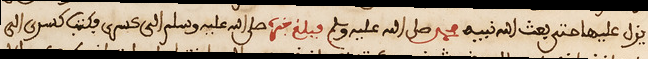يزل عليها حتى بعث الله نبيه محمد صلى الله عليه و سلم فبلغ خبره صلى الله عليه و سلم الى كسرى فكتب كسرى الى
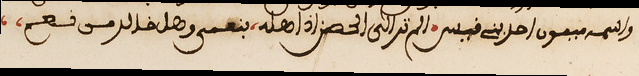واسمه ميمون احد بنى قيس الم تر الى الحضر اذ اهله بنعمى و هل خالد من نعم
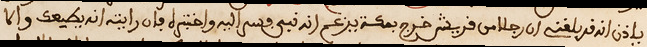ياذن انه قد بلغنه ان رجلا من قريش خرج بمكة يزعم انه نبي فسر اليه و اختبره فان رايته انه يطيعك و الا
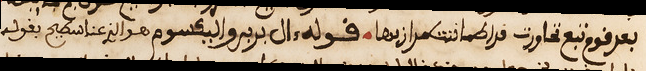بعد قوم تبع تحاورت قد اطمانت بها مرازبها قوله ءال بربر و اليكسوم هو الذي عنا سطيح بقوله
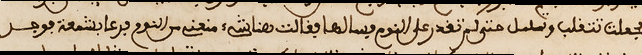فجعلت تتقلب و تململ حتى لم تقدر على النوم فسالها فقالت هنا شىء منعنى من النوم فدعا بشمعة فوجد
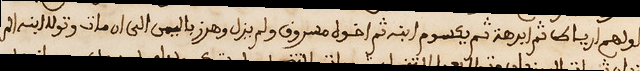اولهم ارياط ثم ابرهة ثم يكسوم ابنه ثم اخوه مسروق و لم يزل وهرذ باليمن الى ان مات و تولا ابنه المر
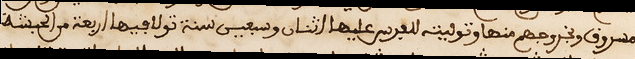مسروق و بخروجهم منها و توليته للفرس عليها اثنان و سبعين سنة تولا فيها اربعة من الحبشة
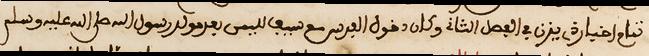تمام اخبار# يذن في الفصل الثاني و كان دخول الفرس مع سيف لليمن بعد مولد رسول الله صلى الله عليه و سلم
